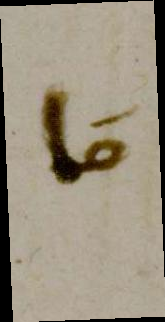مَا
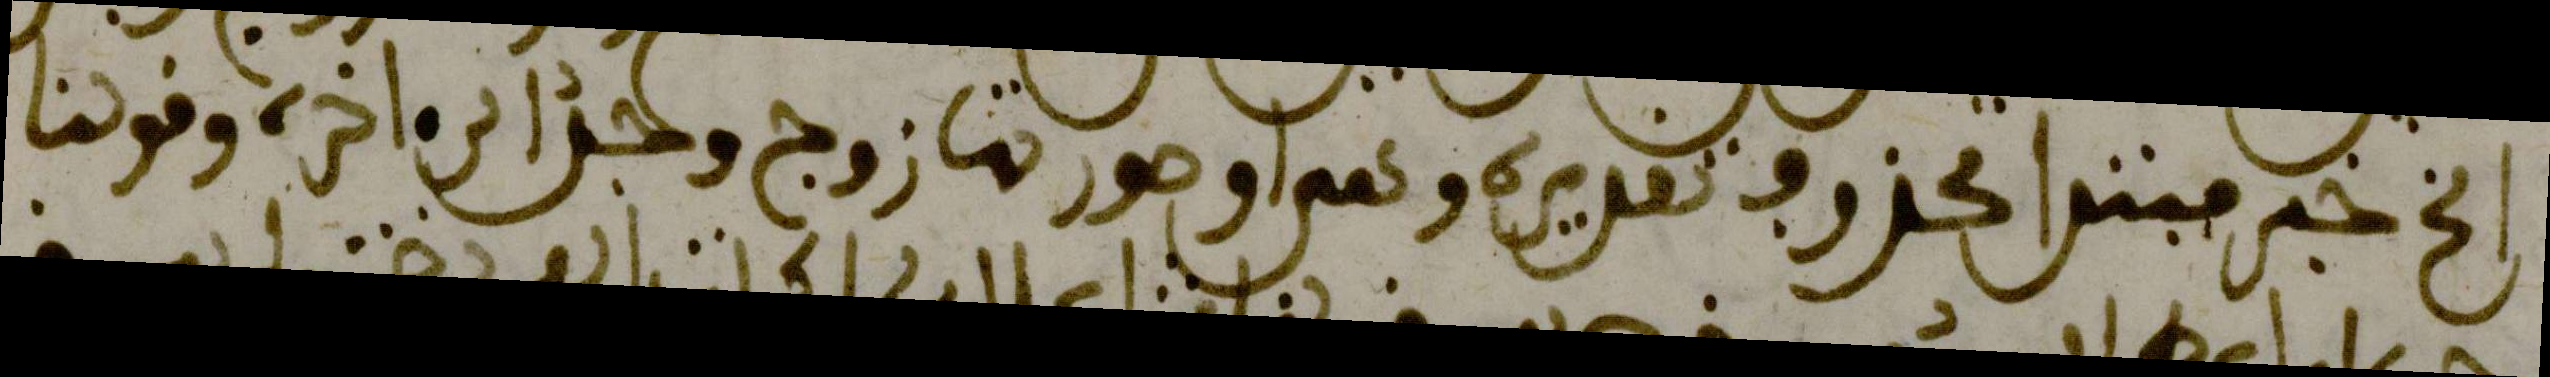الخ خبر مبتدا محذوف تقديره وهي او صورتها زوج وجد الى ءاخره وقولنا
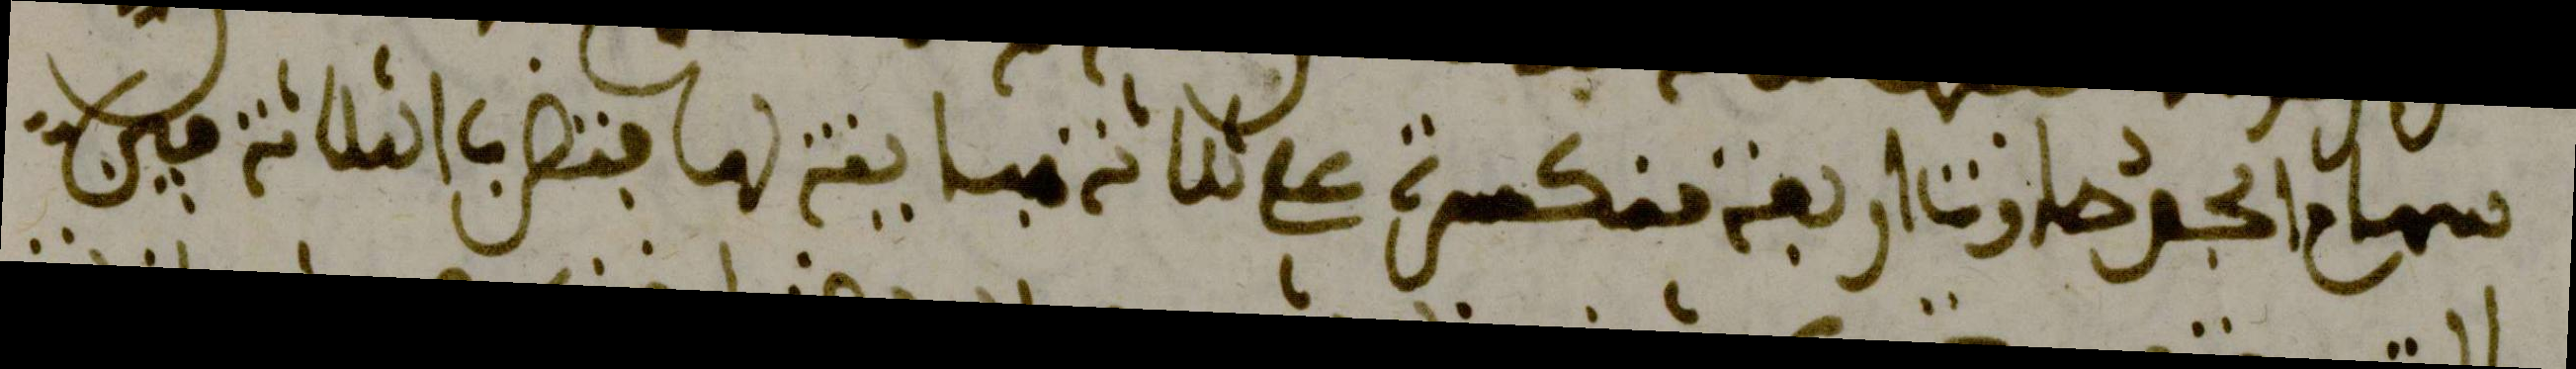سهام الجد صارت اربعة منكسرة على ثلاثة مباينة لها فتضرب الثلاثة في
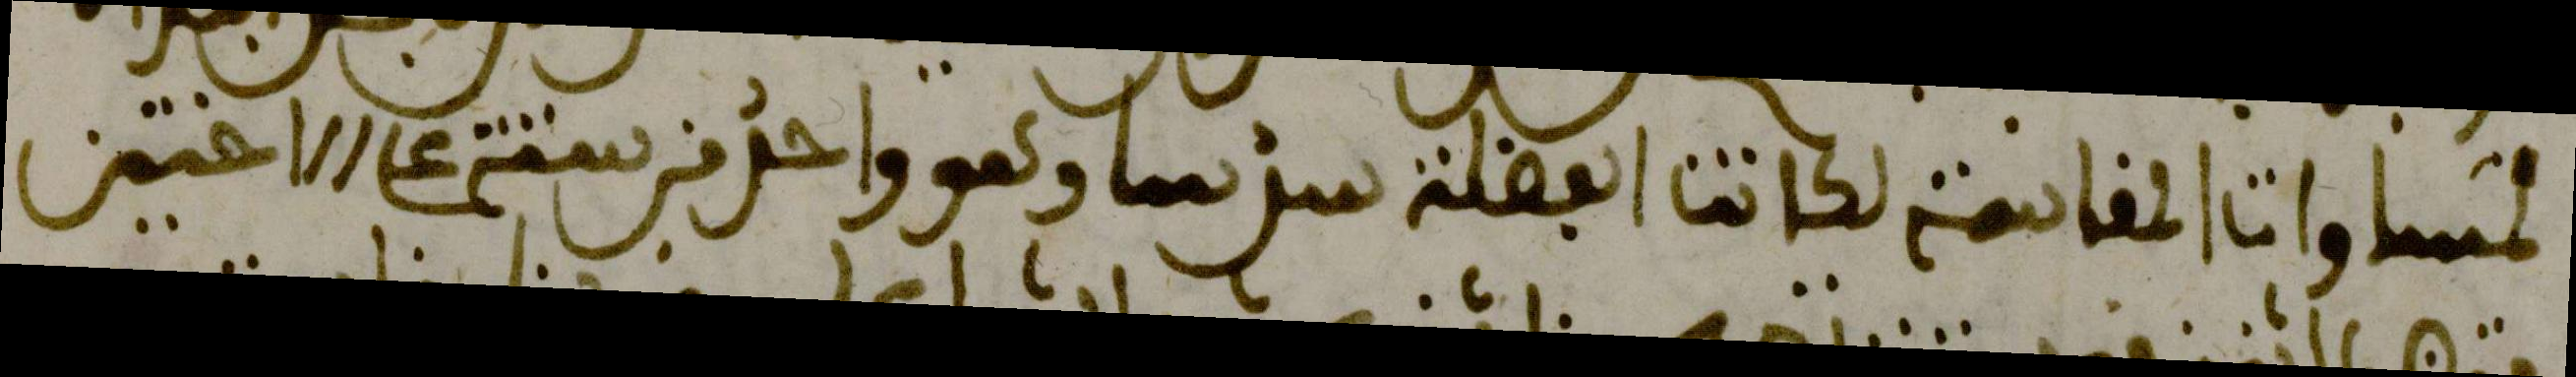لمساوات المقاسمة لكانت الفضلة سدسا وهو واجد من ستة على الاختين
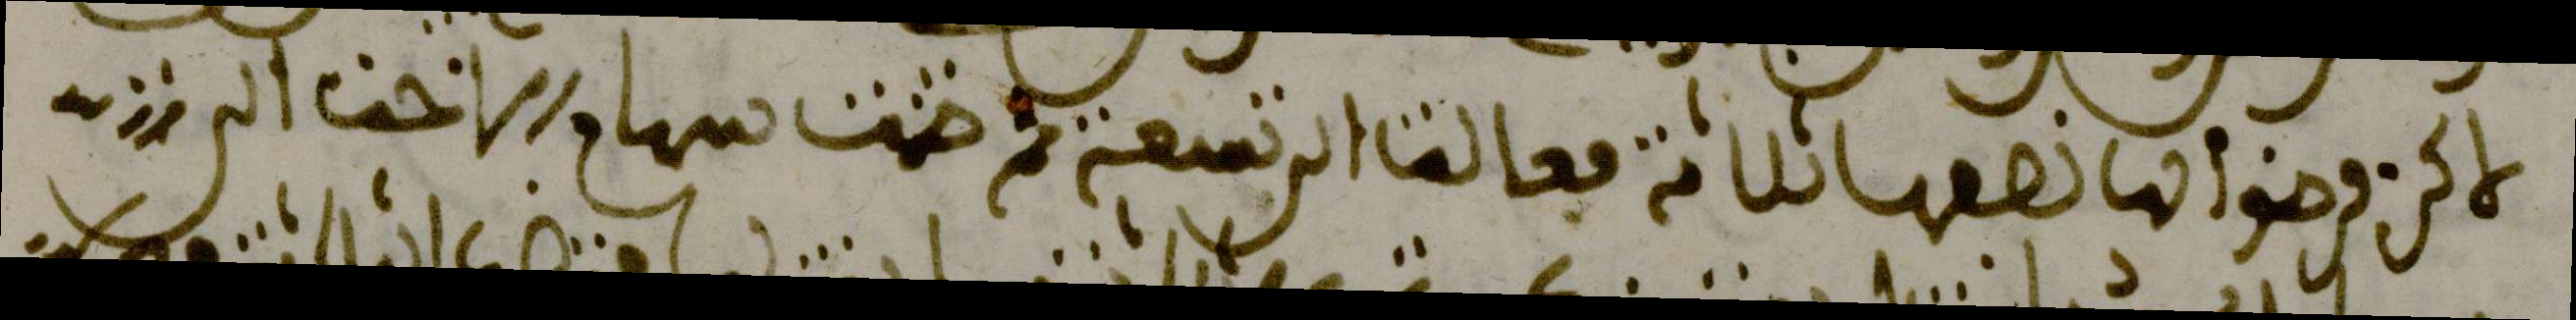لاكن فرضوا لها نصفها ثلاثة فعالت الى تسعة ثم ضمت سهام الاخت الى
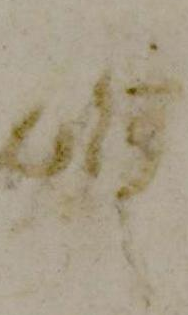وَان
